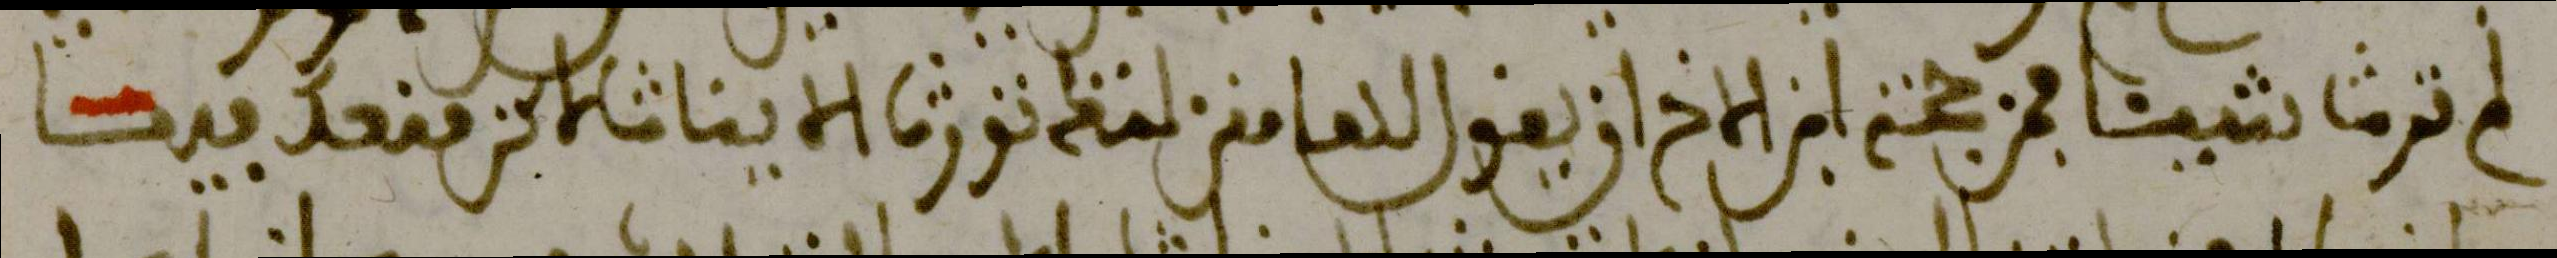لم ترث شيئا فمن حجة ابن الاخ ان يقول لها منزلتك تورث الايناث لاكن منعك فيها
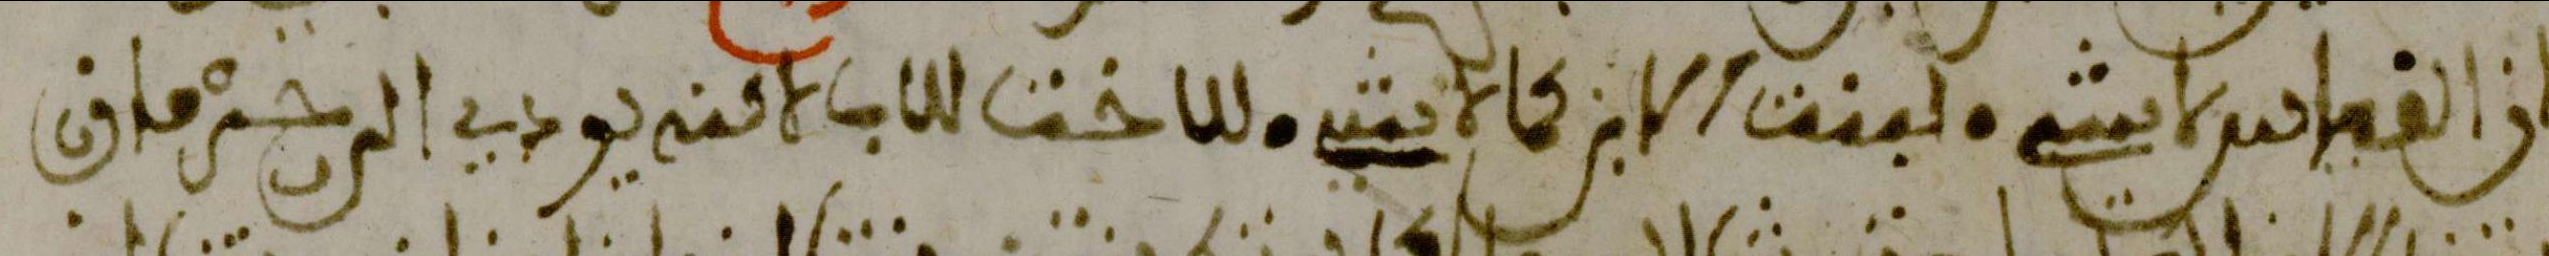ان القياس لا شيء لبنت الابن كما لا شيء للاخت للاب لاكنه يودي الى حرْمان
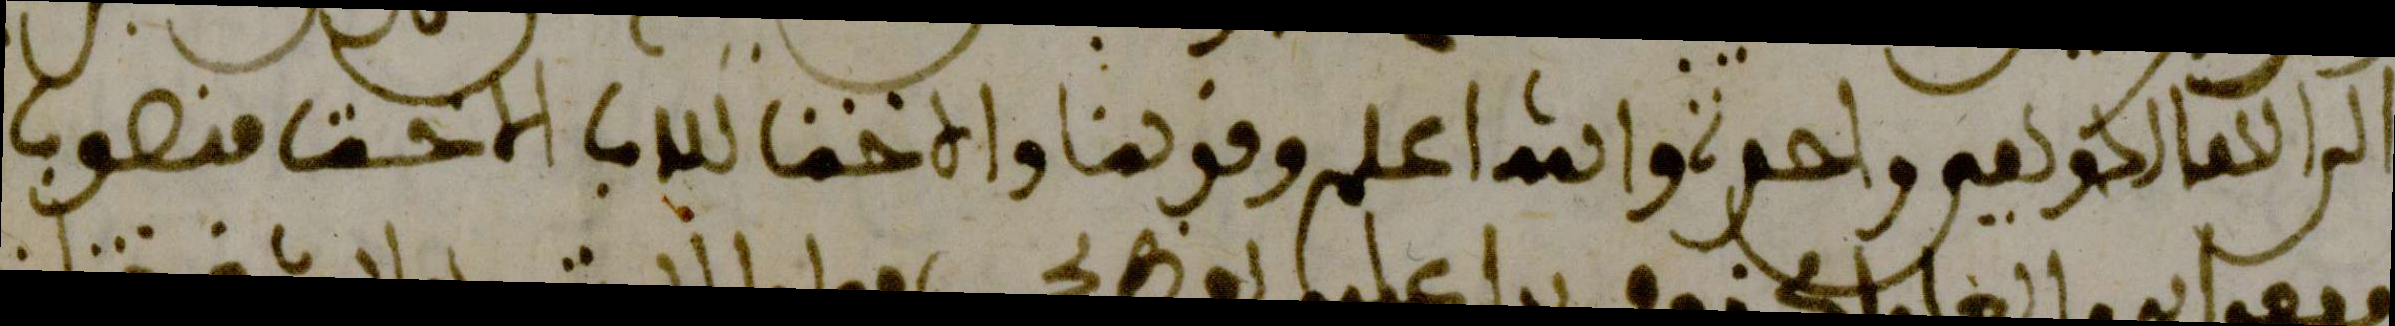الى الهالك وهي واحدة والله اعلم وقولنا والاخت للاب الاخت منصوب
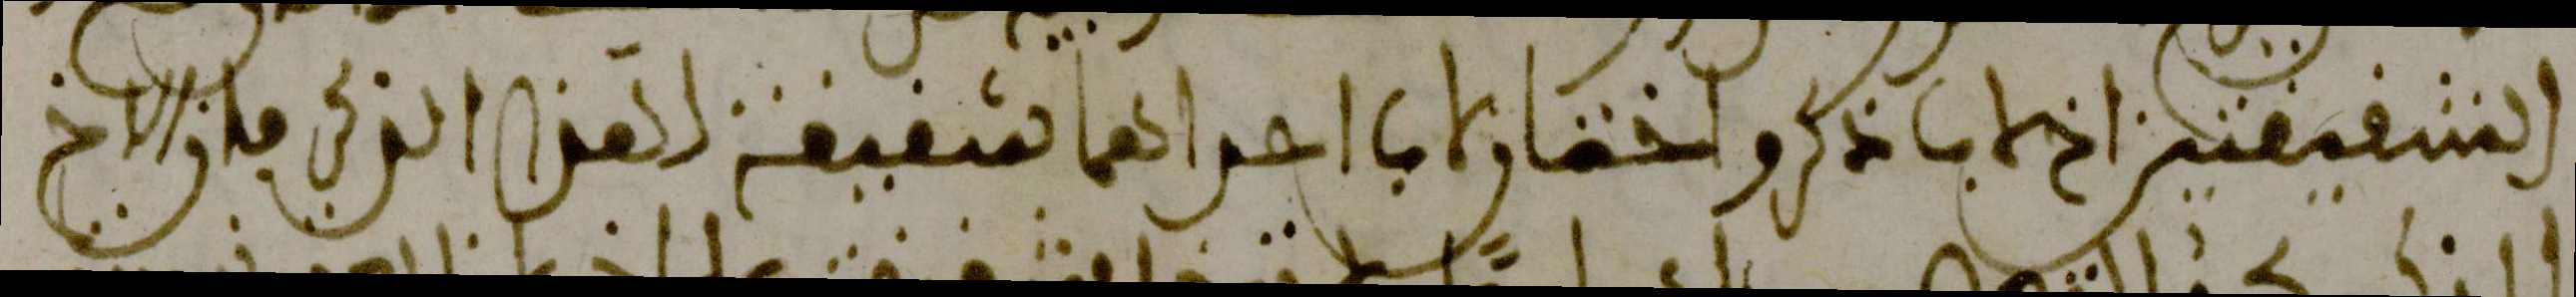الشقيقتين اخ لاب ذكر واختان لاب احداهما شقيقة لهذا الذكر فان الاخ
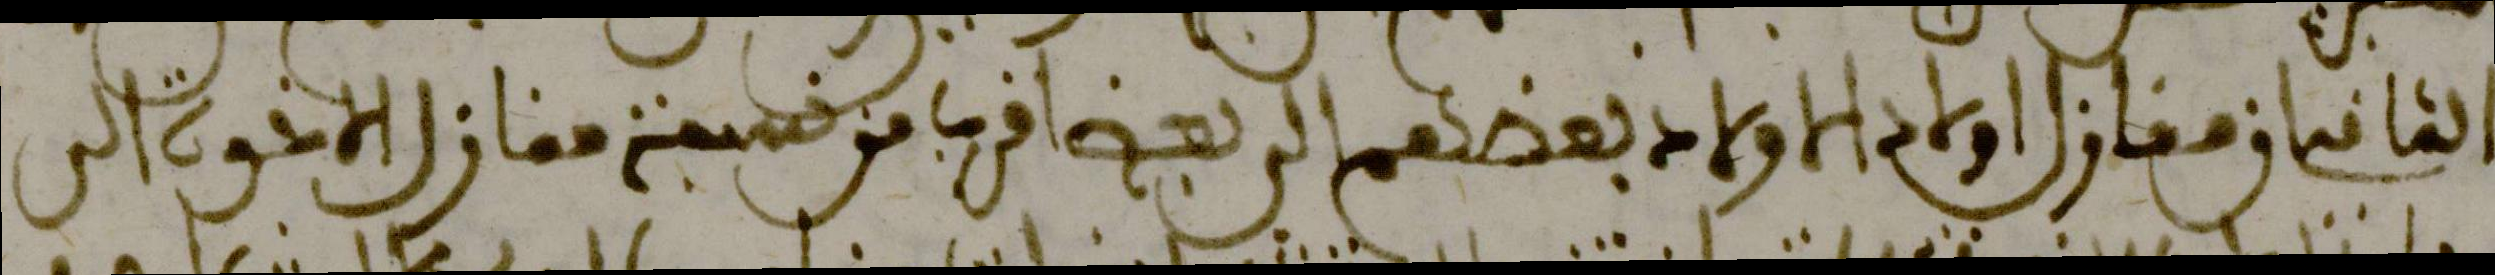الثاني ان منازل اولاد الاولاد بعضهم الى بعض اقرب من نسبة منازل الاخوة الى
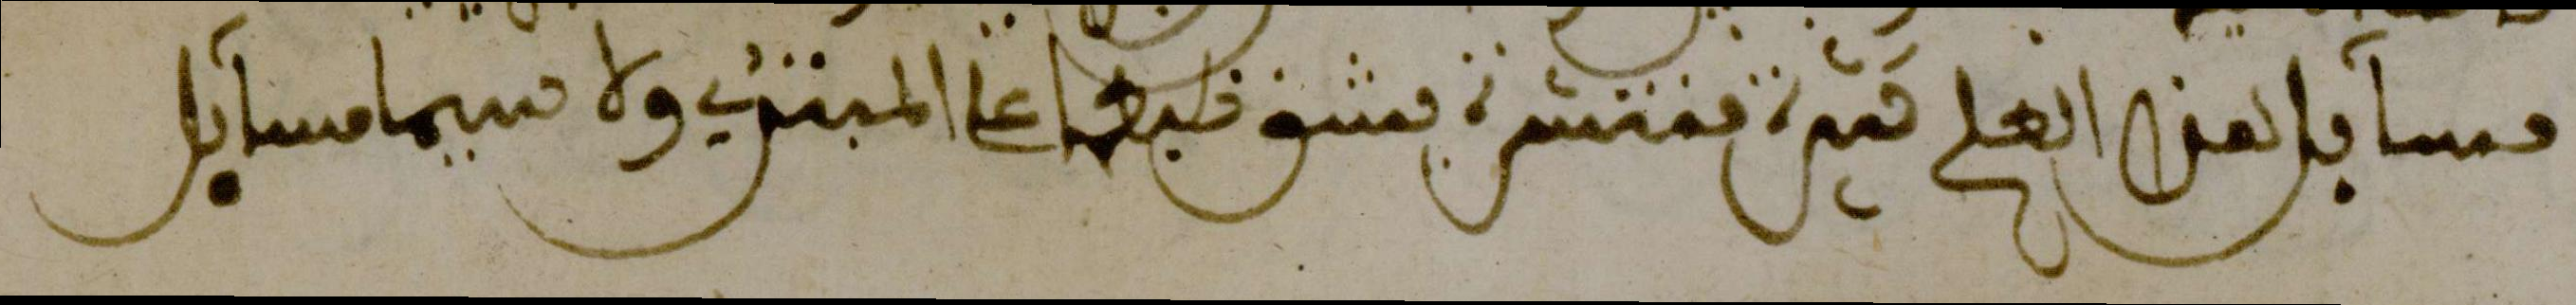مسائل هذا العلم كثيرة منتشرة يشق ظبطها على المبتدي ولا سيما مسائل
